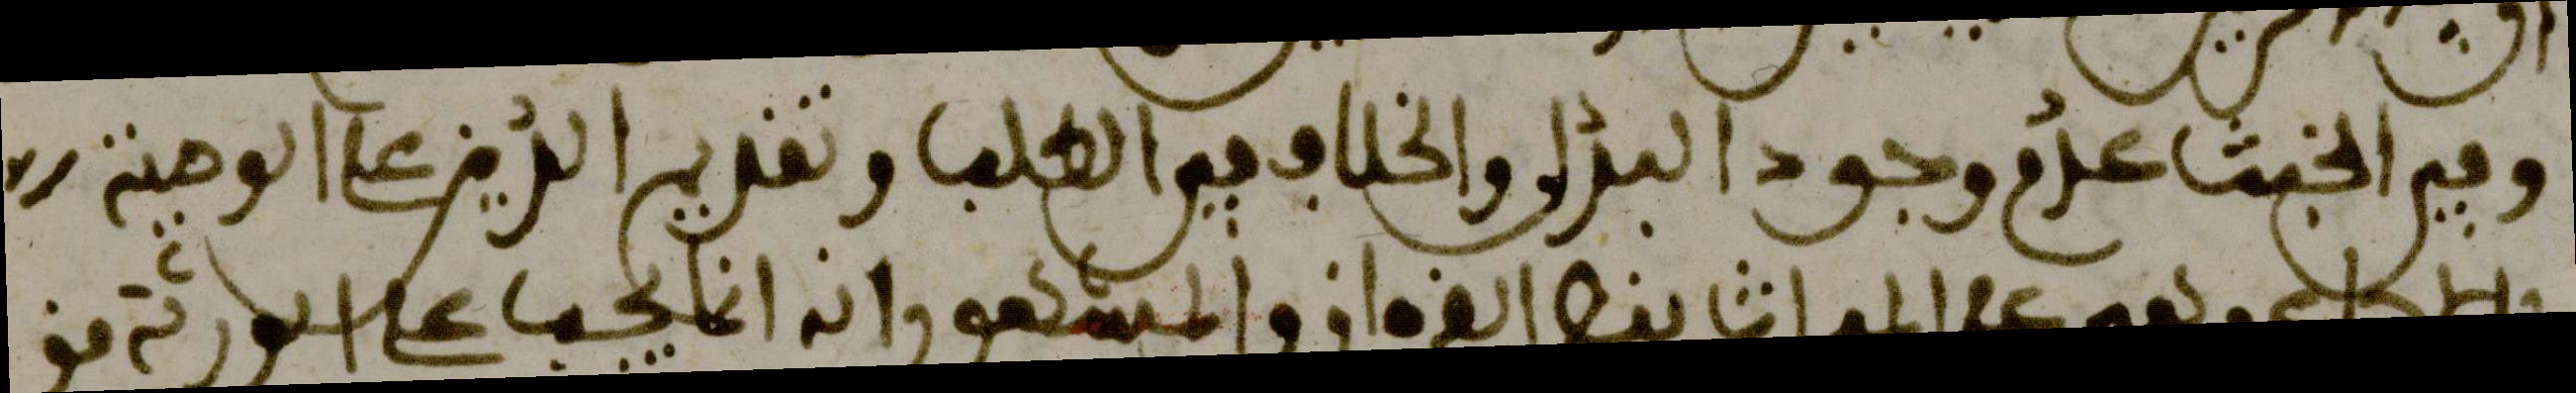وفي الخبث عدم وجود البدل والخلاف في الطلب وتقديم الدين على الوصية
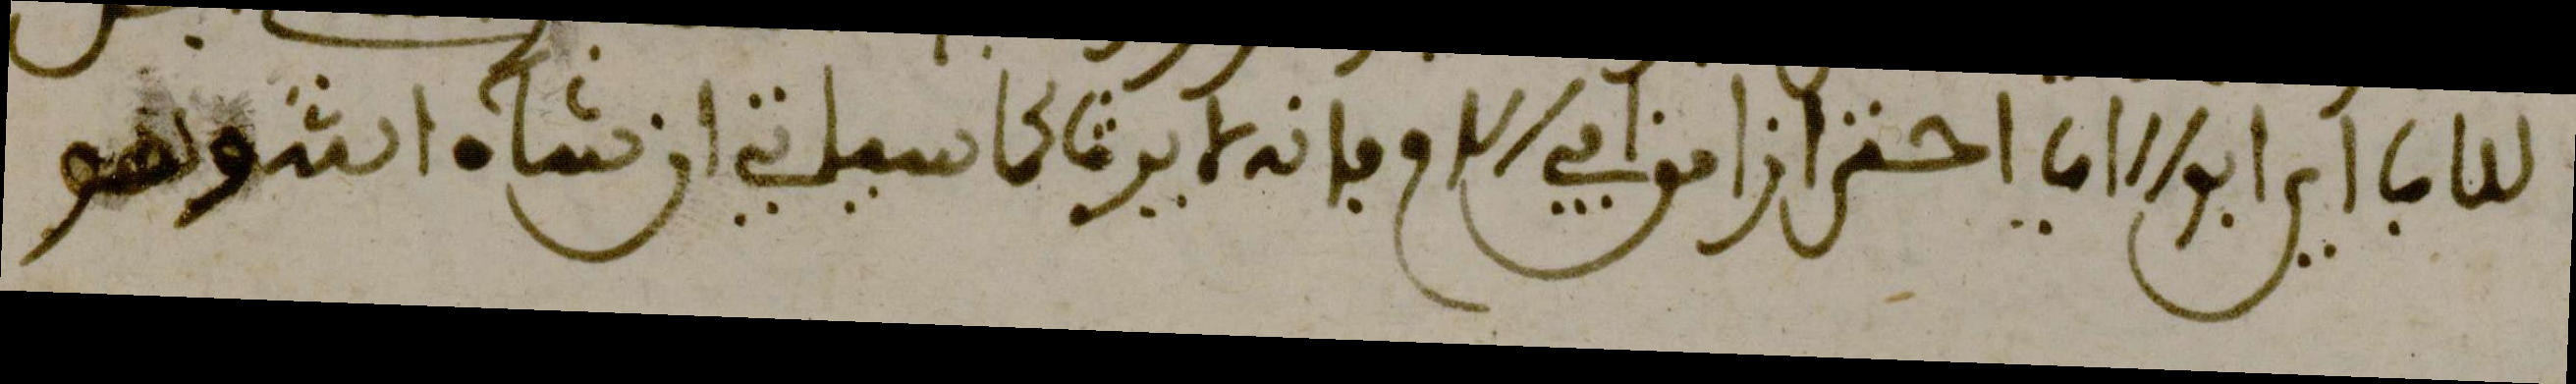للاب اي ابو الاب احترازا من ابي الام فانه لا يرث كما سياتي ان شاء الله وهو
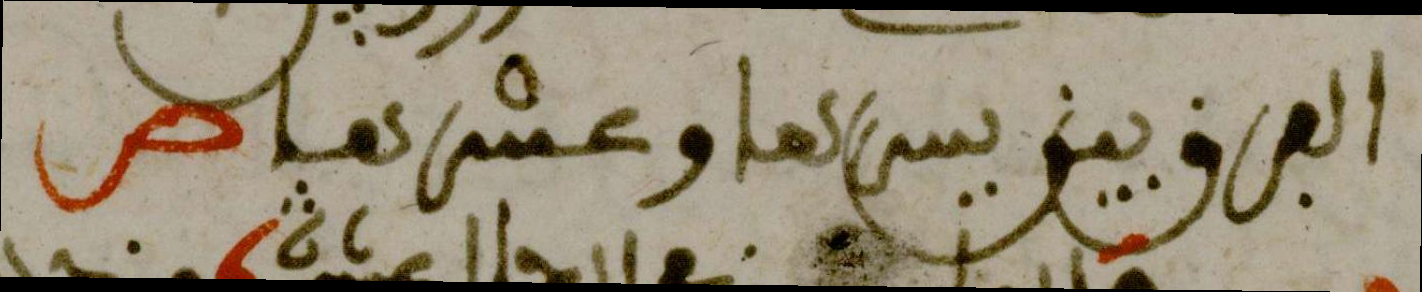الفرق بين يسرها وعسْرها ص
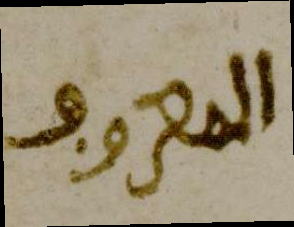المعروف
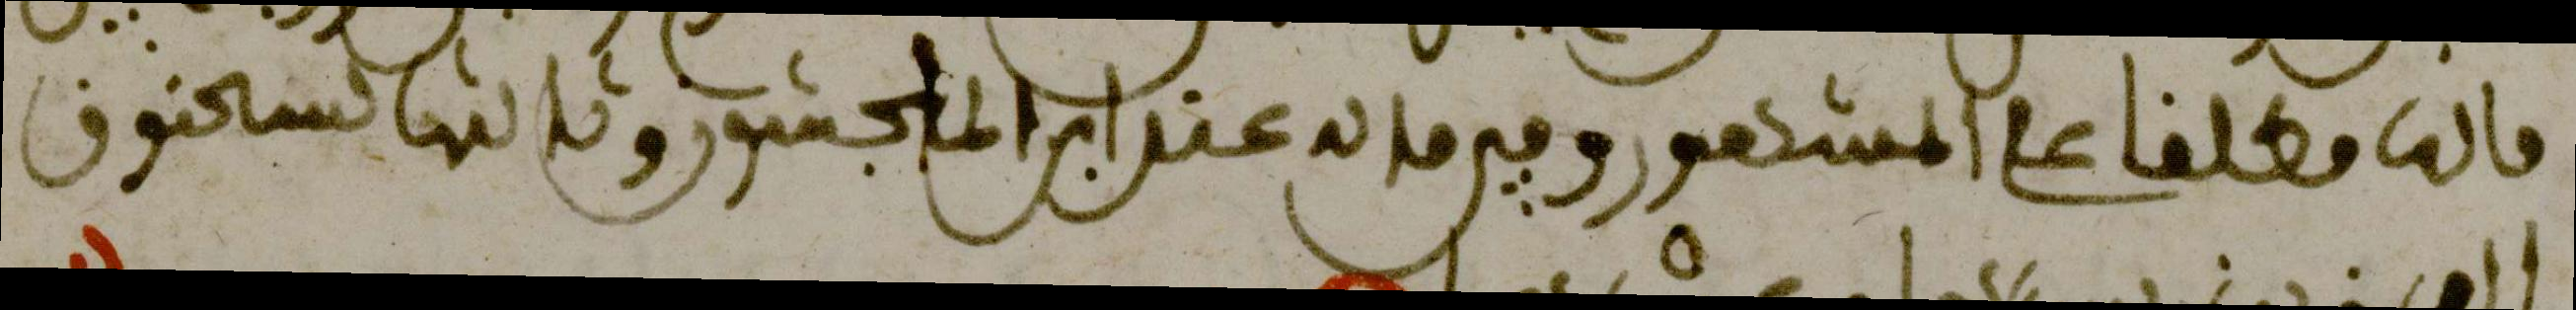مالها مطلقا على المشهور وفي ماله عند ابن المجشون وثالثها لسحنون
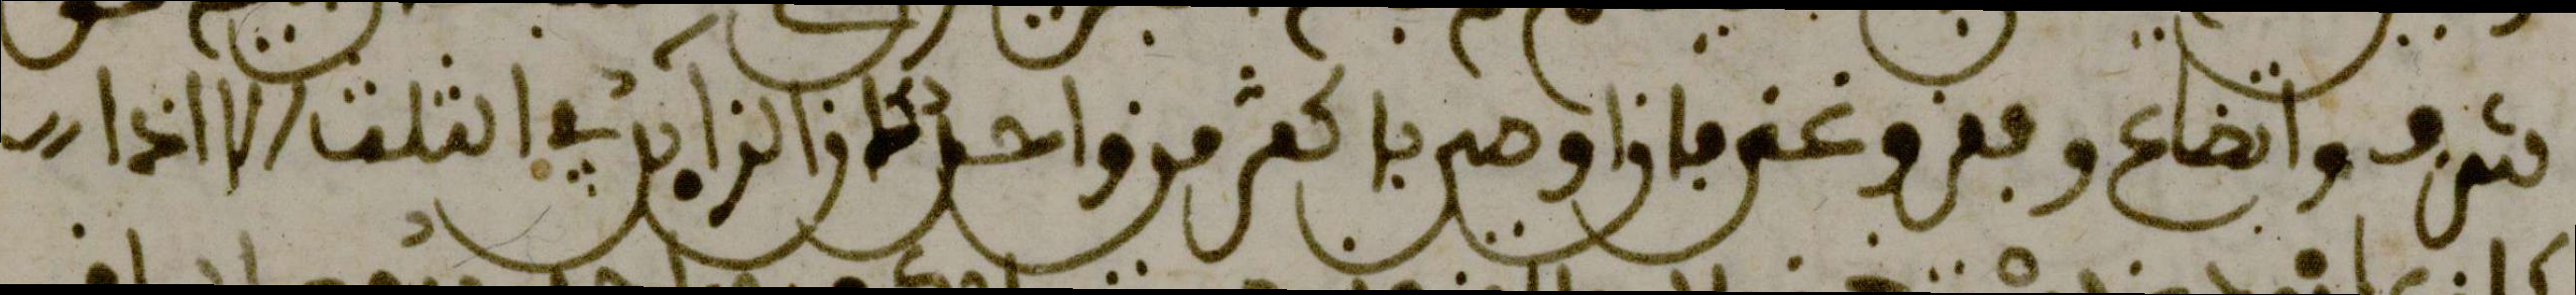شرف واتضاع وفقر وعنى فان اوصى باكثر من واحد كان الزائد في الثلث الا اذا
